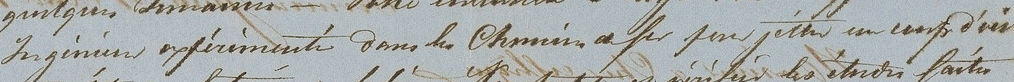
Ingénieur expérimenté dans les Chemins de fer pour jetter un coup d'oeil
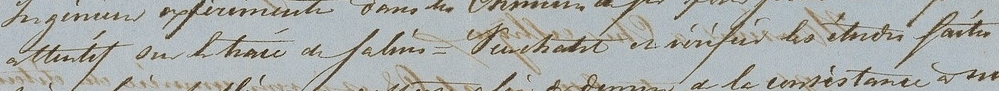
attentif sur le tracé de Salins–Neuchatel et vérifier les études faites
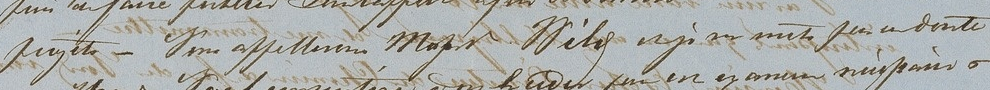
projets. Nous appellerons Mons Wild et je ne mets pas en doute
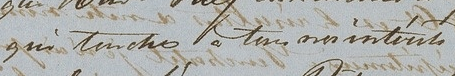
qui touche à tous nos intérets.
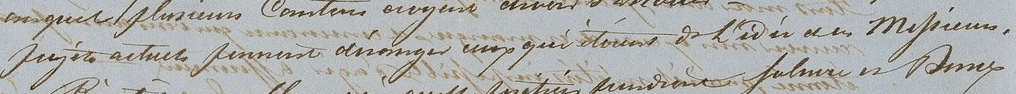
projets actuels pourront déranger ceux qui étaient ds l'idée des Messieurs.
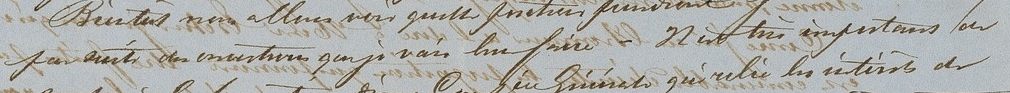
par suite des ouvertures que vais leur faire. Il est très important de
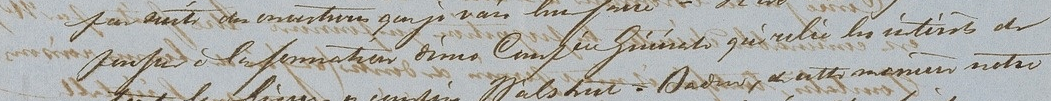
penser à la formation d'une Compie Générale qui relie les intérets de
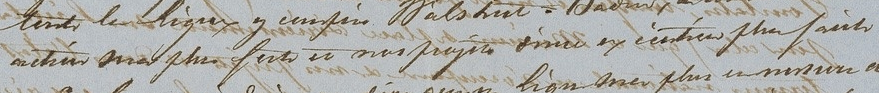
action sera plus forte et nos projets d'une exécution plus facile.
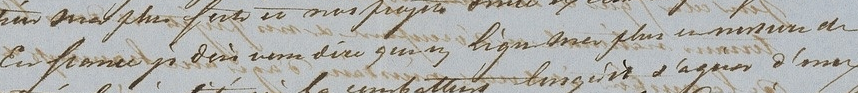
En France je dois vous dire que notre ligne sera plus en mesure de
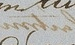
renseigné.
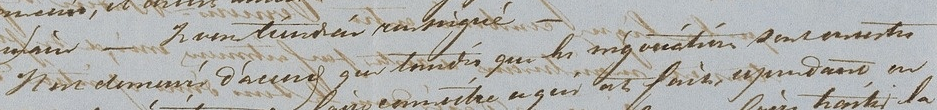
Il est demeuré d'accord que tandis que les négociations sont ouvertes
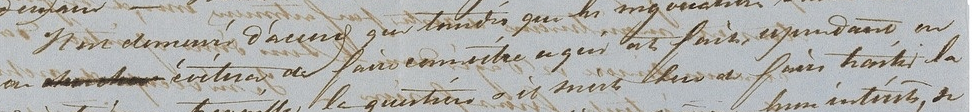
on chercher évitera de faire connaitre ce qui est fait, cependant on
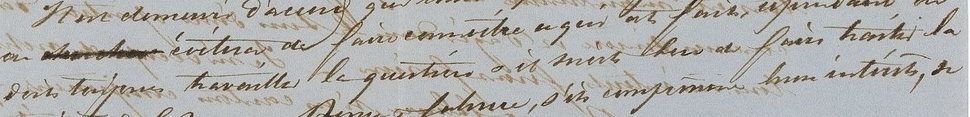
doit toujours travailler la question & il serait bon de faire traiter la
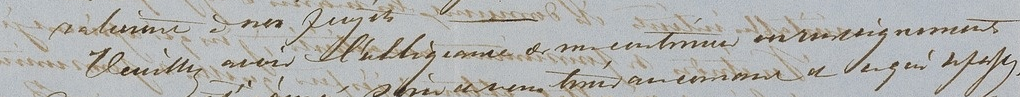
Veuillez avoir l'obligence de me continuer au renseignement.
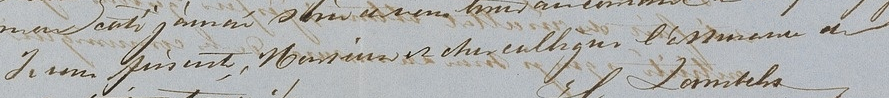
Je vous présente, Monsieur et cher collègue l'assurance de
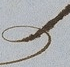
F.
